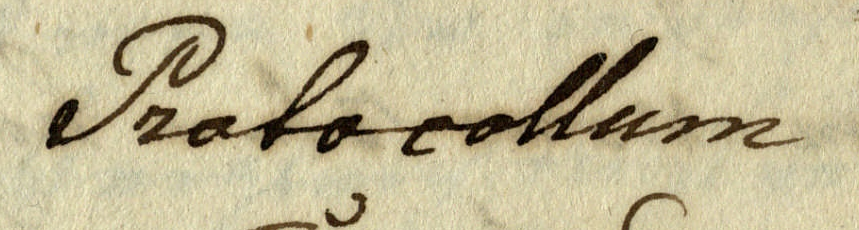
Protocollum
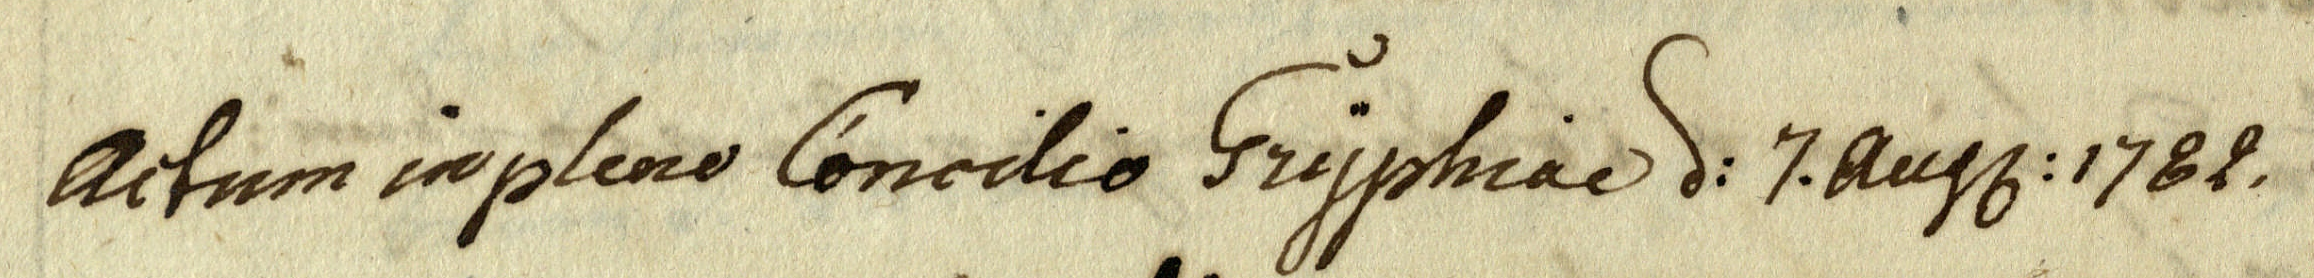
Actum in pleno Concilio Gryphiae d. 7. Aug. 1782.
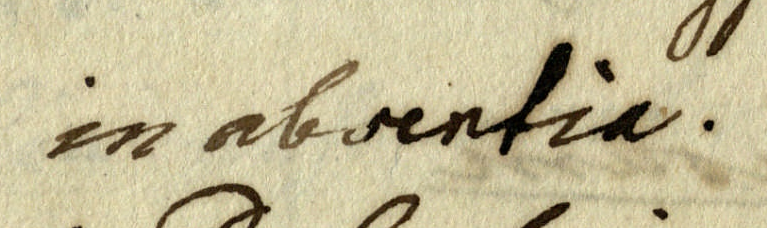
in absentia.
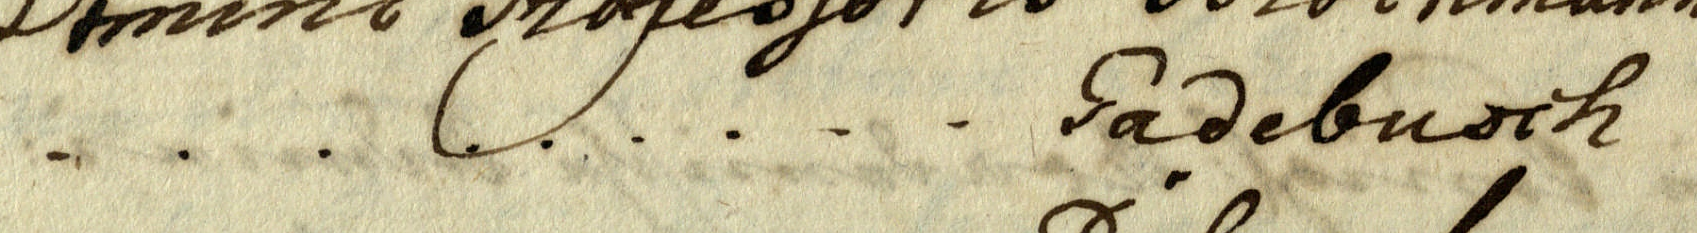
Gadebusch
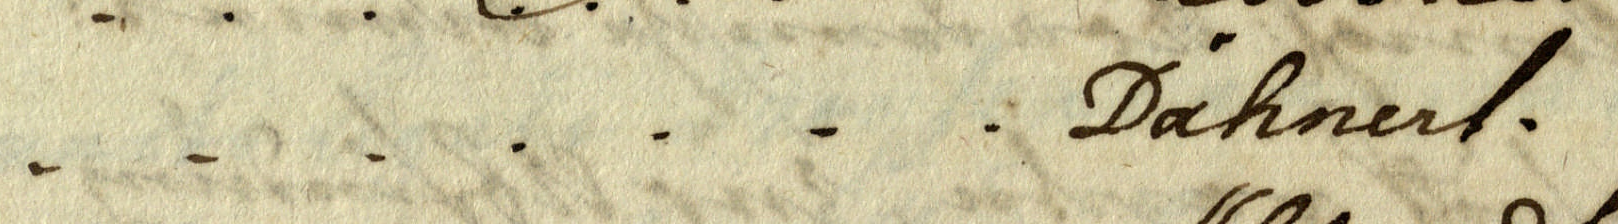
Dähnert.
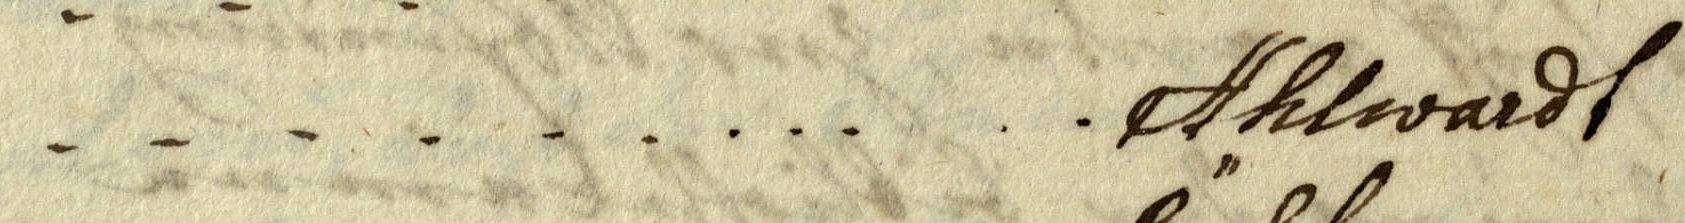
Ahlwardt
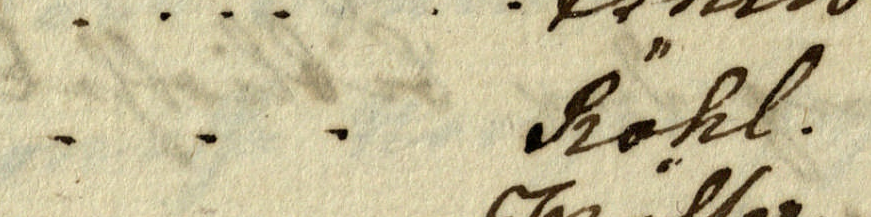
Röhl.
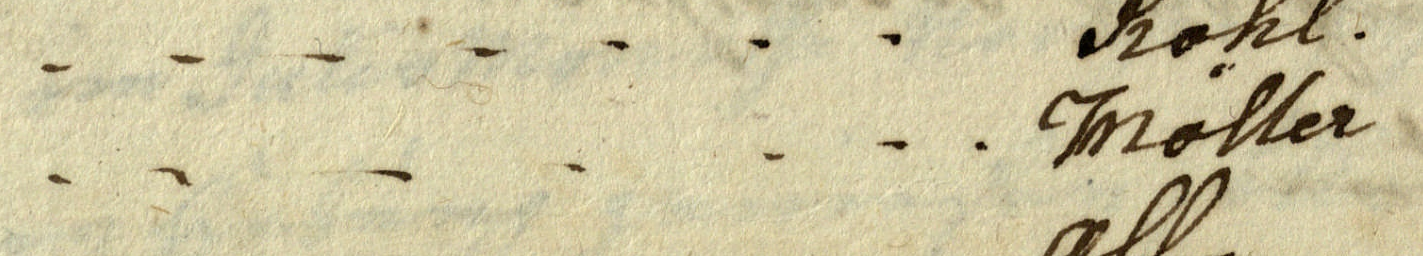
Möller
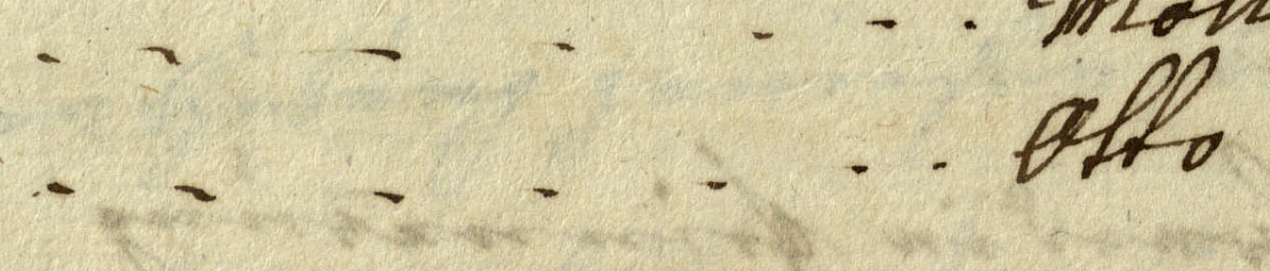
Otto.
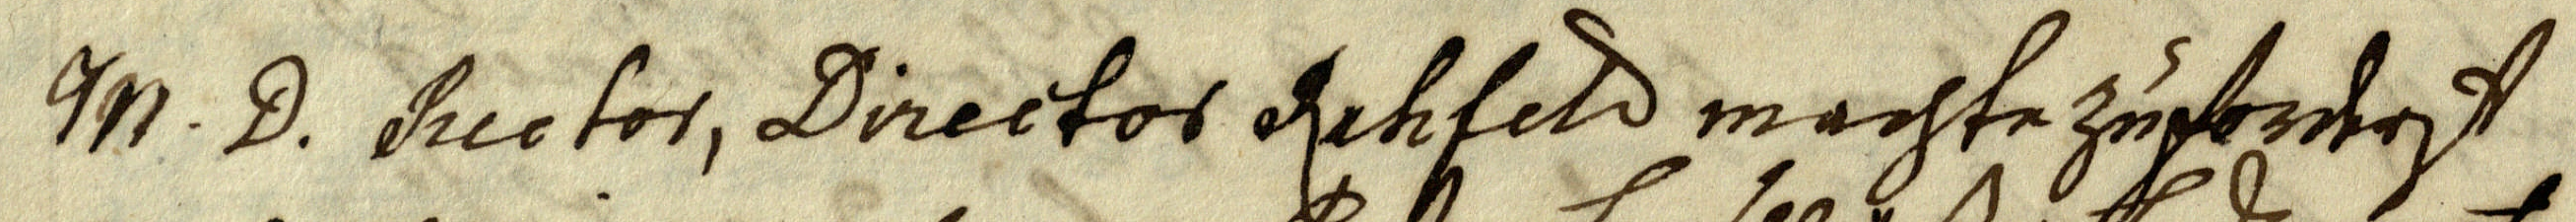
M. D. Rector, Director Rehfeld machte zuforderst
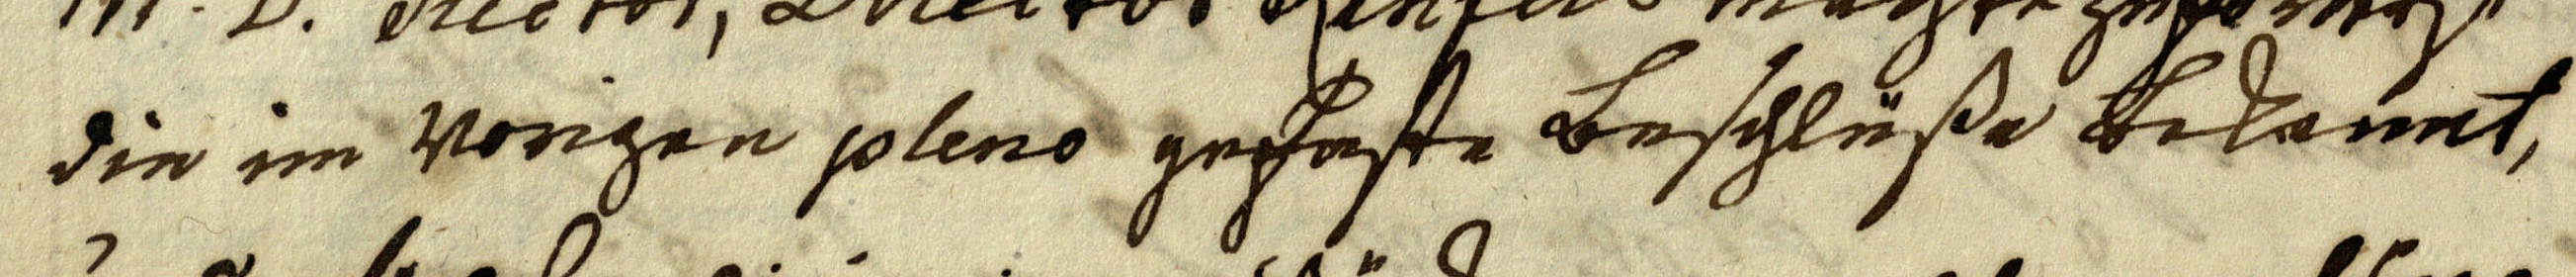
die im vorigen pleno gefaste Beschlüße bekannt,
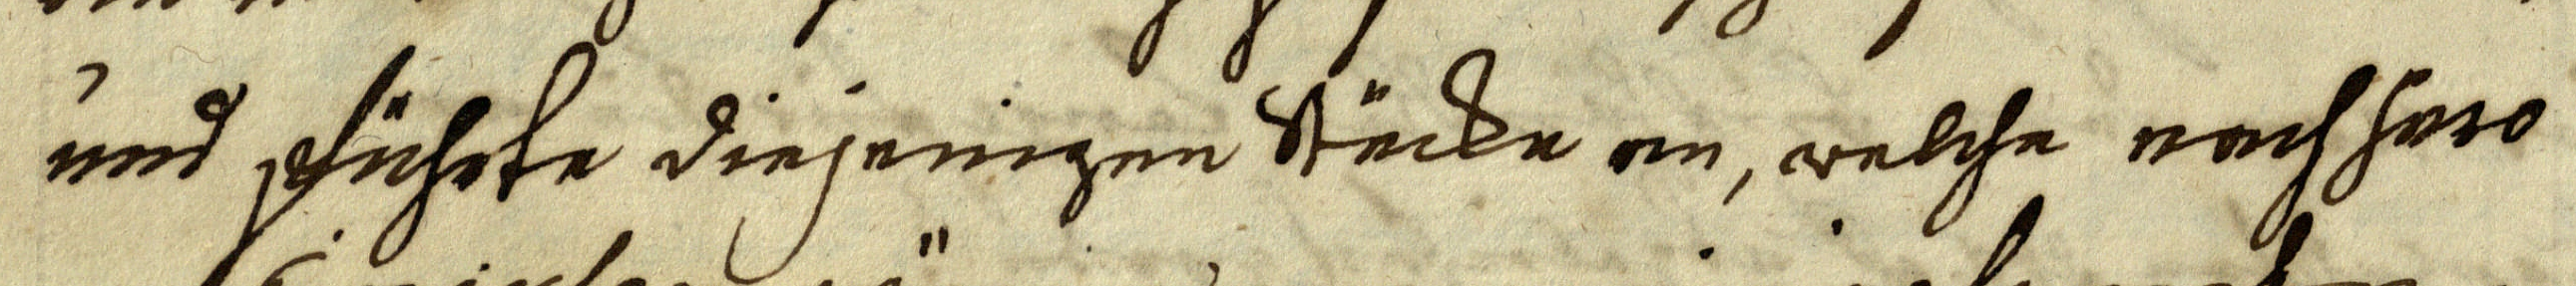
und führte diejenigen Stücke an, welche nachhero
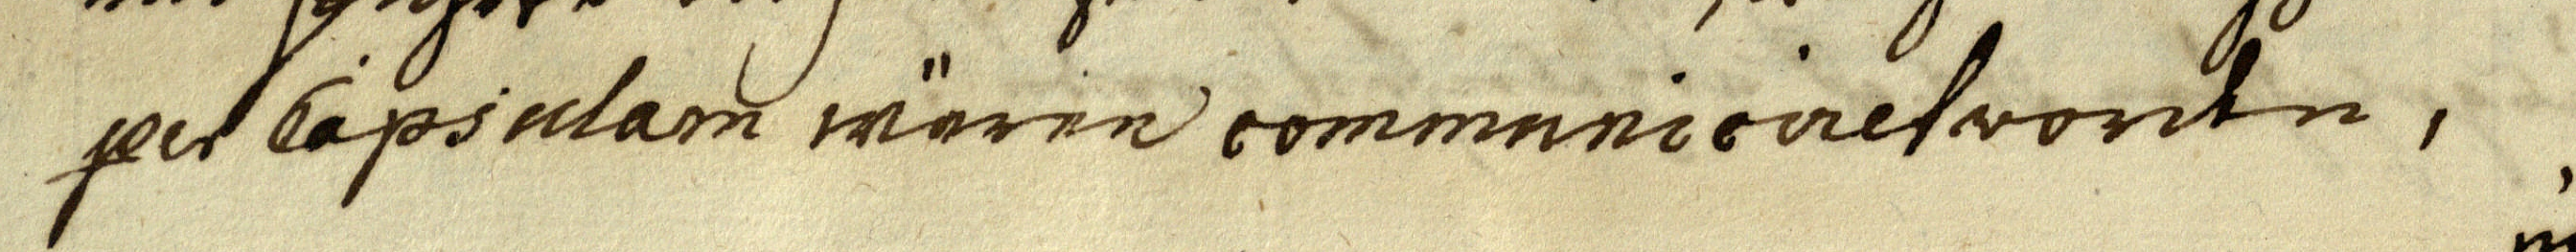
per Capsulam wären communiciret worden,
